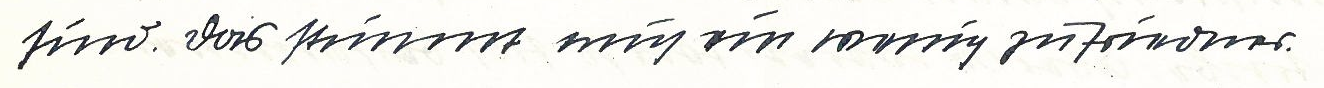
sind. Das stimmt mich ein wenig zufriedener.
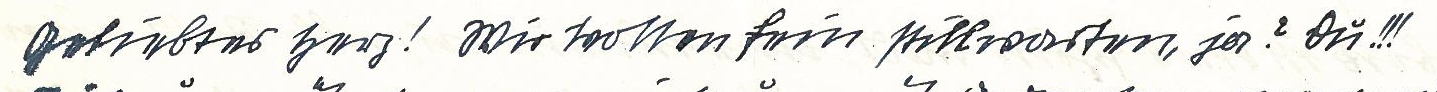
Geliebtes Herz! Wir wollen fein still warten, ja? Du!!!
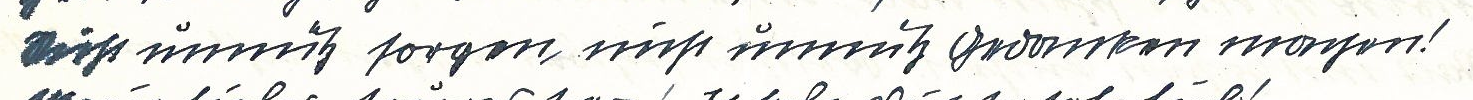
Nicht unnütz sorgen, nicht unnütz Gedanken machen!
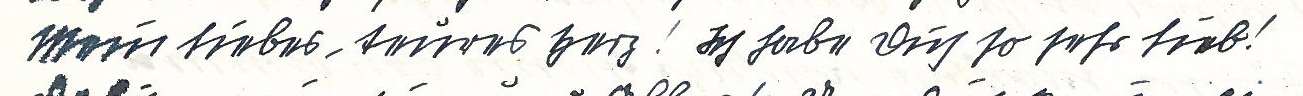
Mein liebes, teures Herz! Ich habe Dich so sehr lieb!
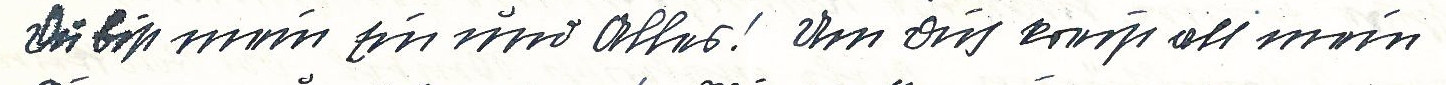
Du bist mein Ein und Alles! Um Dich kreist all mein
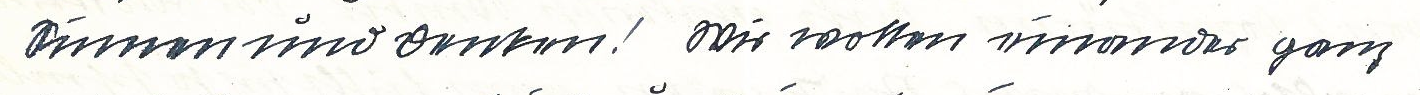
Sinnen und Denken! Wir wollen einander ganz
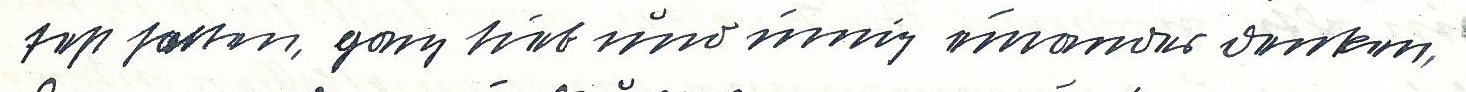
fest halten, ganz lieb und innig einander denken,
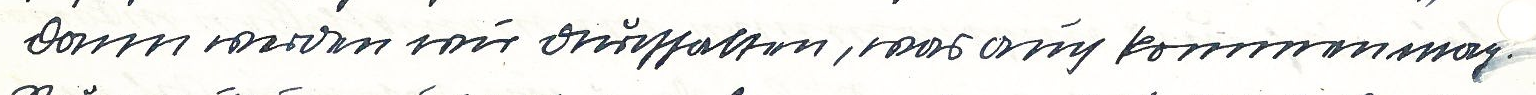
dann werden wir durchhalten, was auch kommen mag.
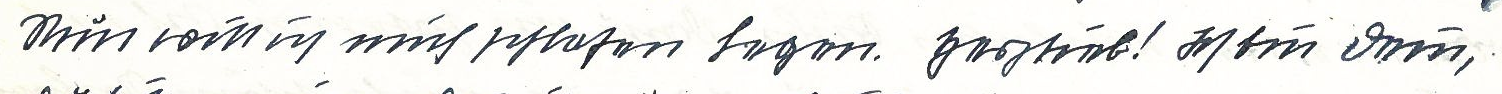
Nun will ich mich schlafen legen. Herzlieb! Ich bin Dein,
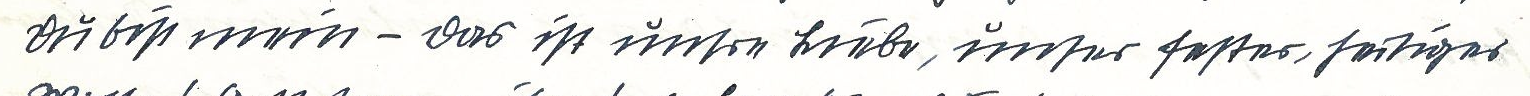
Du bist mein – das ist unsre Liebe, unser fester, heiliger
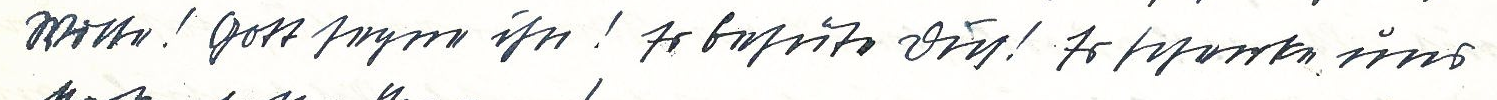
Wille! Gott segne ihn! Er behüte Dich! Er schenke uns
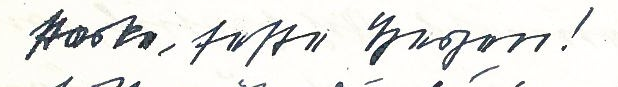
starke, feste Herzen!
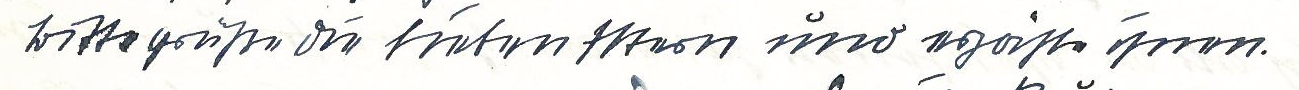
Bitte grüße die lieben Eltern und erzähle ihnen.
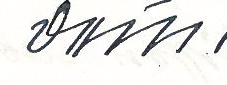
Dein
